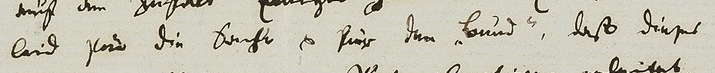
leid für die Sache & für den «Bund», daß dieses
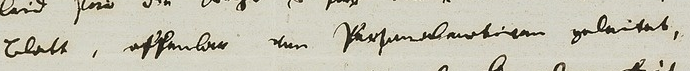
Blatt, offenbar von Personalmotiven geleitet,
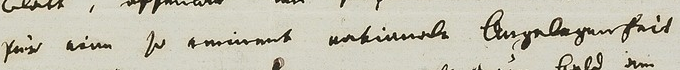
für eine so eminent nationale Angelegenheit
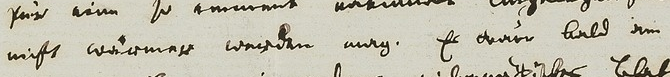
nicht wärmer werden mag. Es wäre bald am
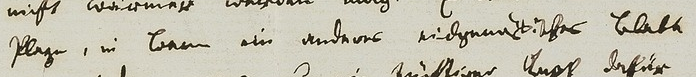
Plaze, in Bern ein anderes eidgenössisches Blatt
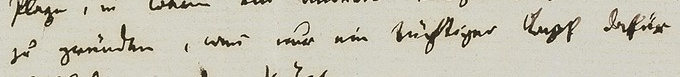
zu gründen, wenn nur ein tüchtiger Kopf dafür
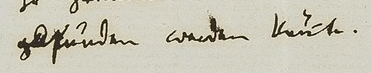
gefunden werden könnte.
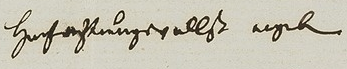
Hochachtungsvollst ergeben
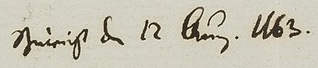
Zürich den 12 Aug. 1863.
